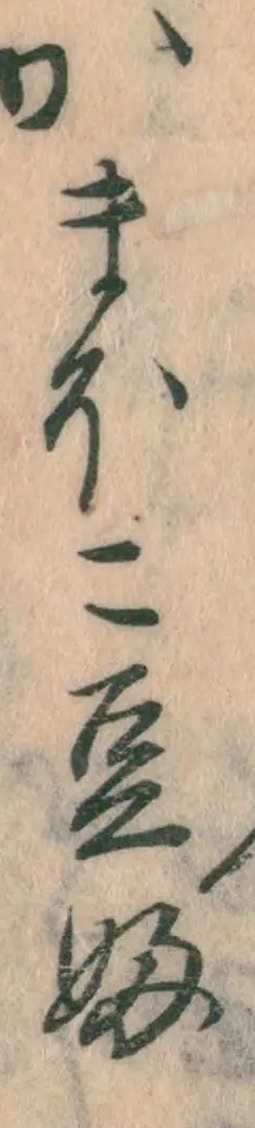かまほこ豆ふ
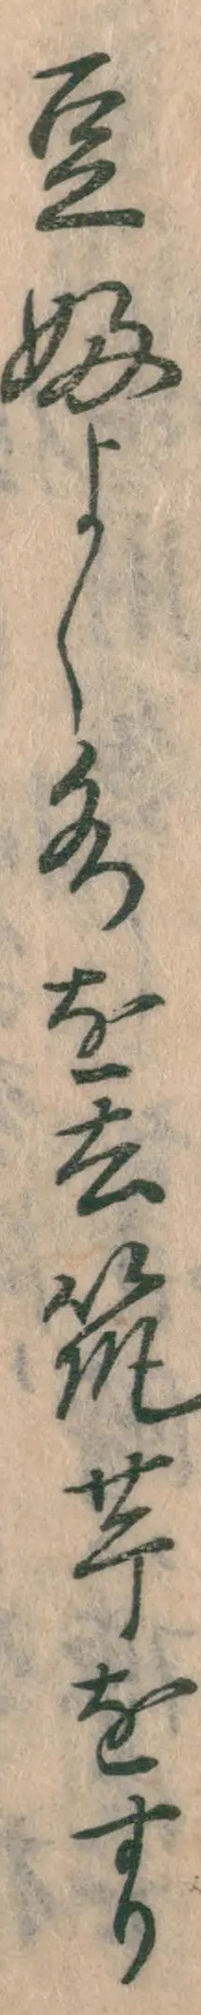豆ふよく水を去筑芋をすり
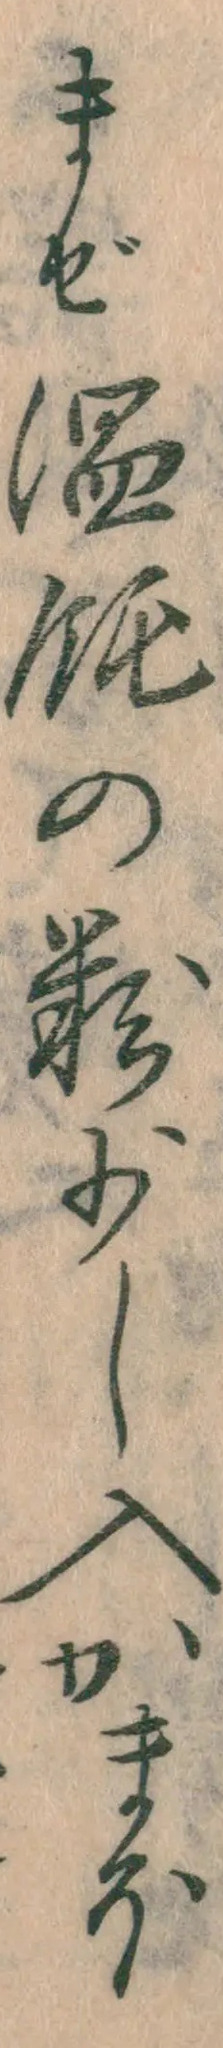まぜ温飩の粉少し入かまほ
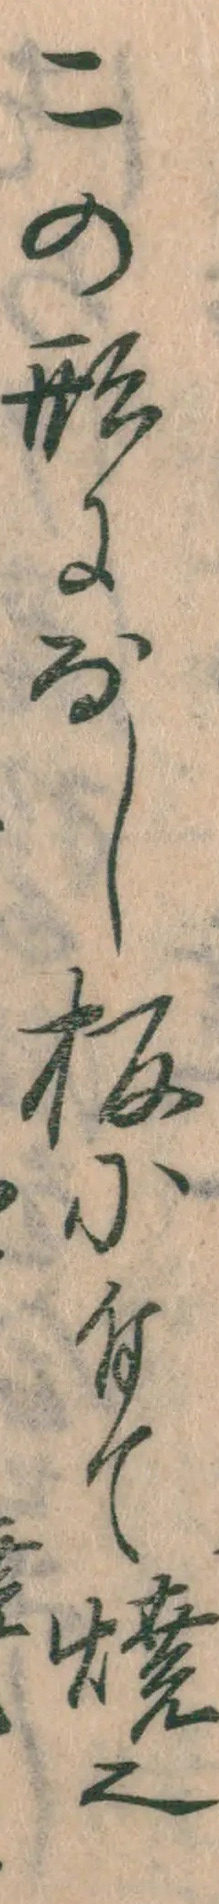この形になし板に付て焼也
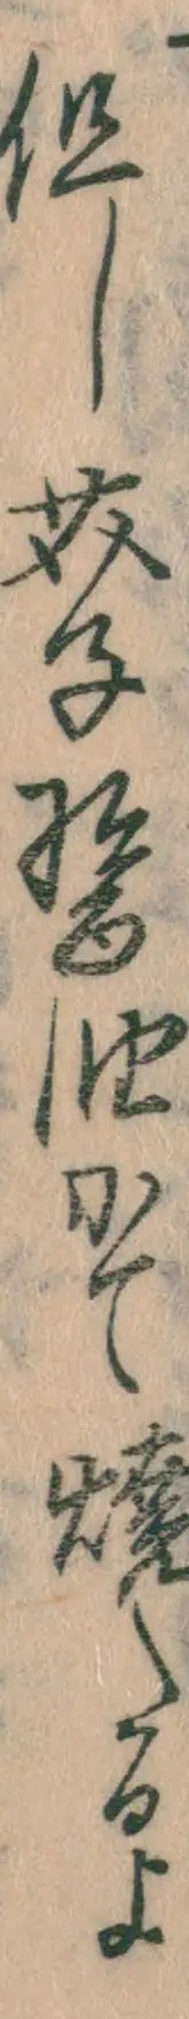但し芥子醤油にて焼たるよ
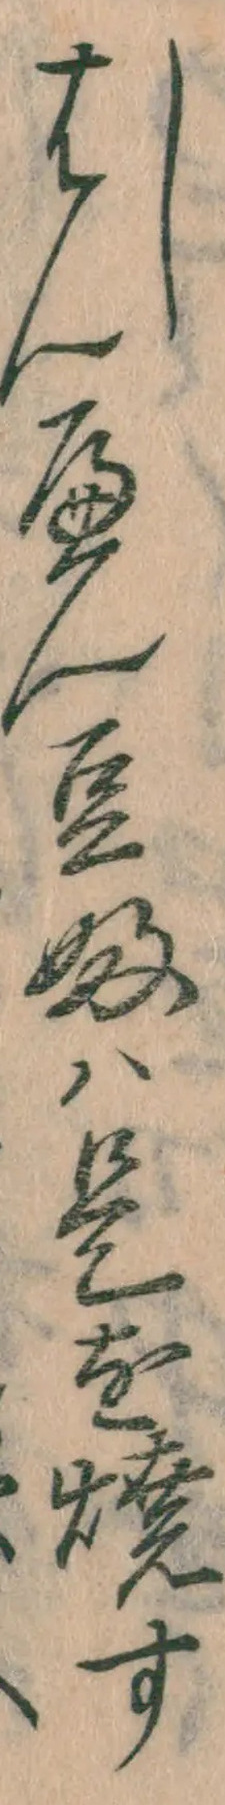はんへん豆ふは是を焼す
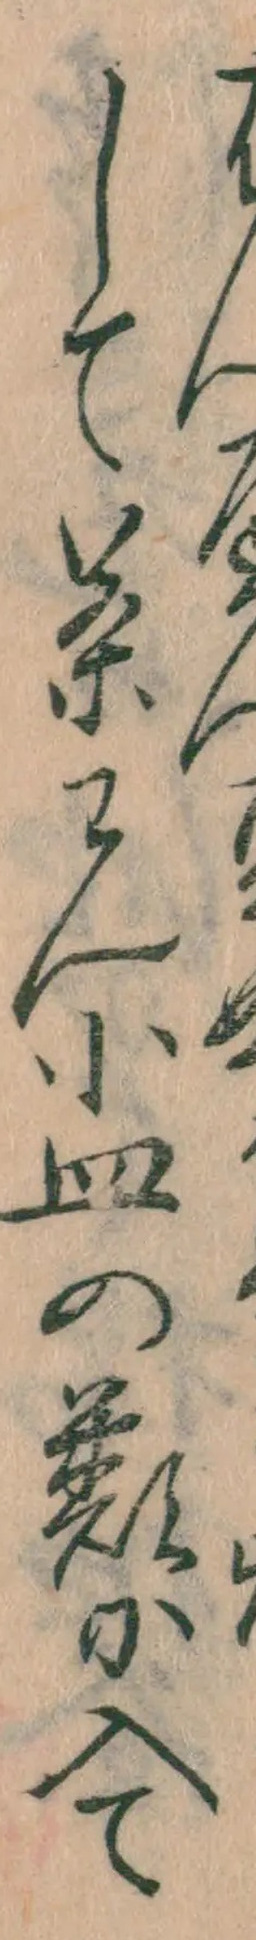して茶わん小皿の類に入て
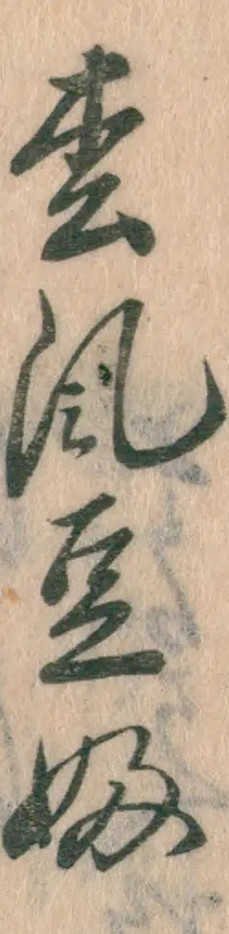松風豆ふ
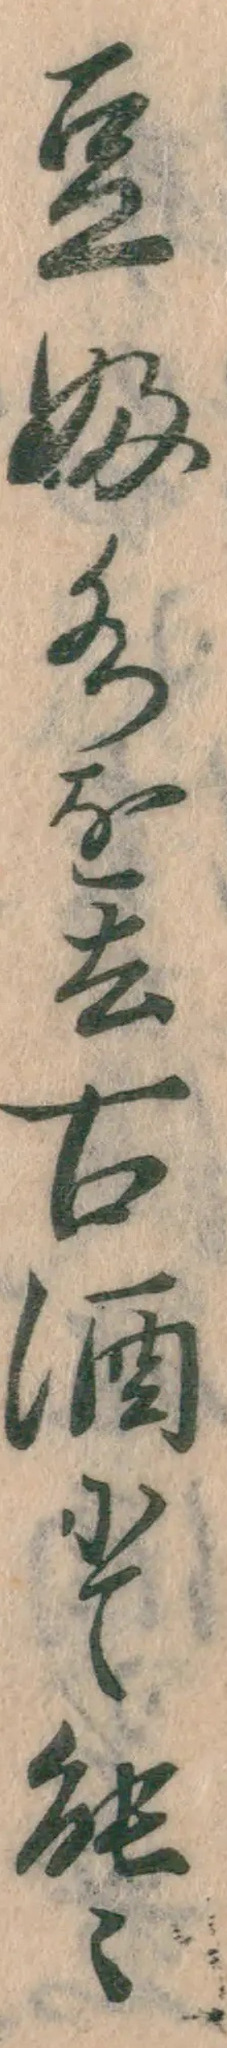豆ふ水を去古酒にて能々
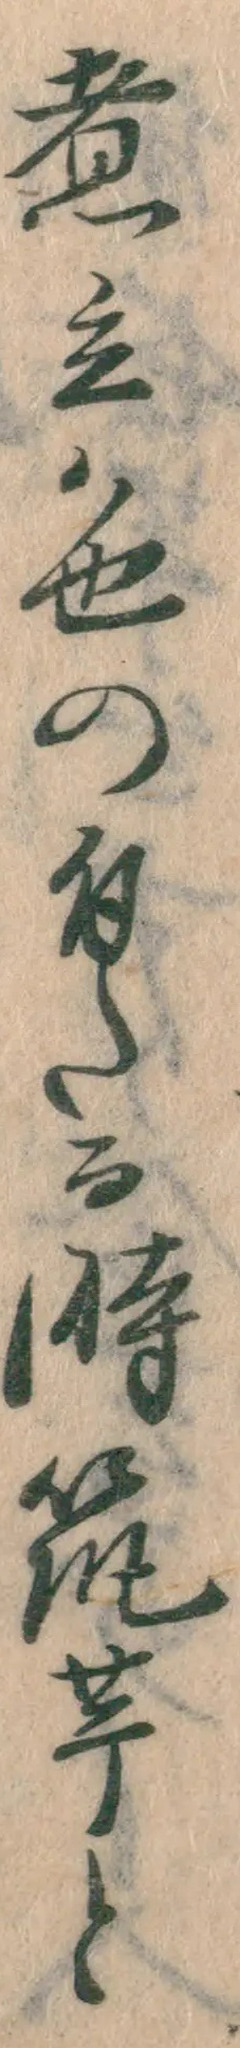煮立色の付たる時筑芋と
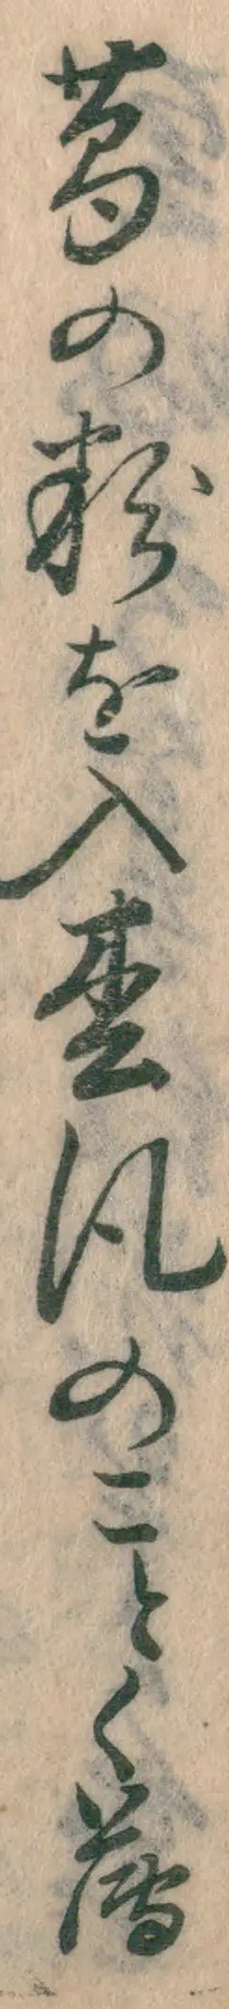葛の粉を入松風のことく薄
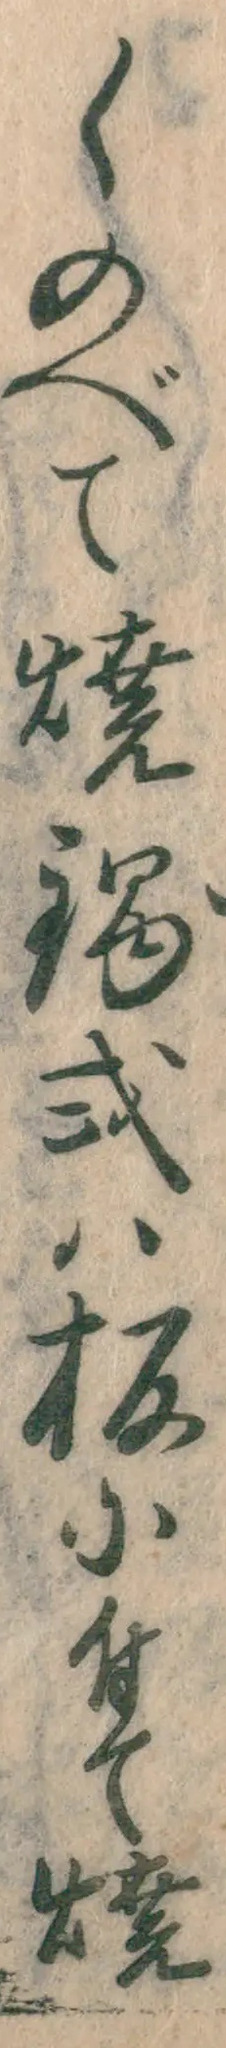くのべて焼鍋或は板に付て焼
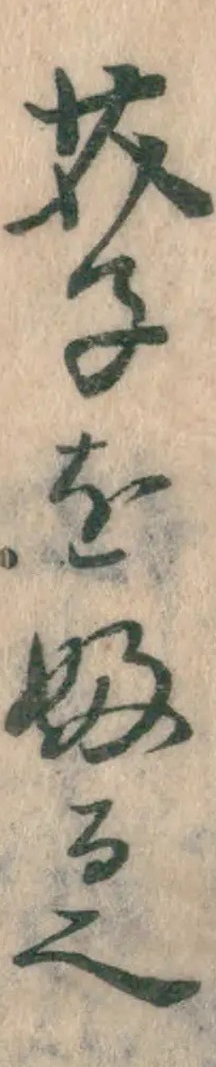芥子をふる也

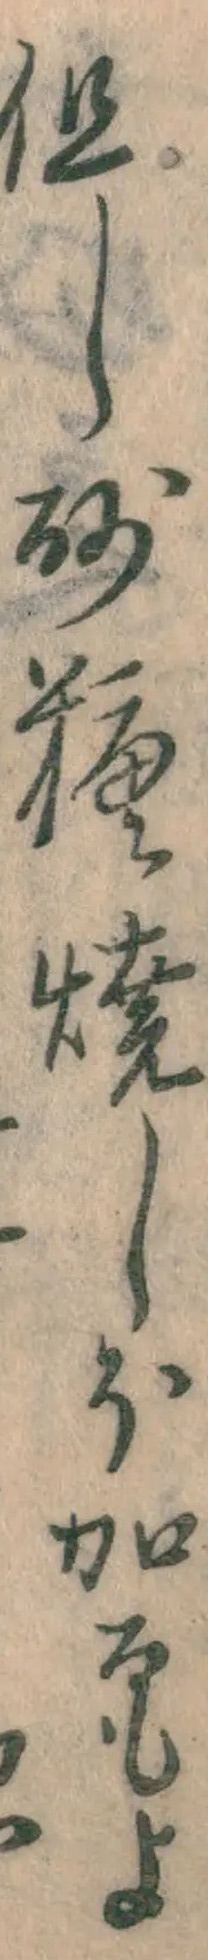但し砂糖焼しほ加るもよ
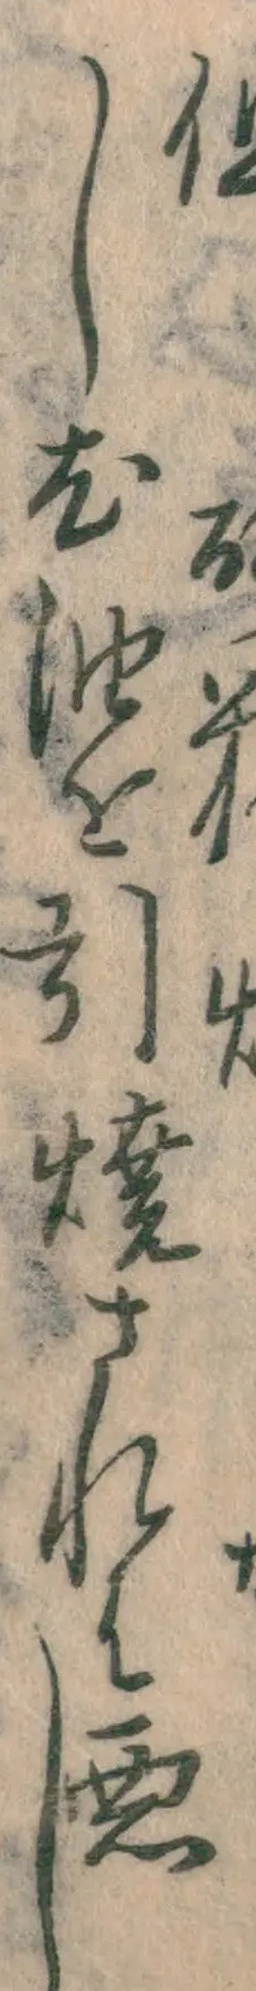し尤油を引焼されは悪し
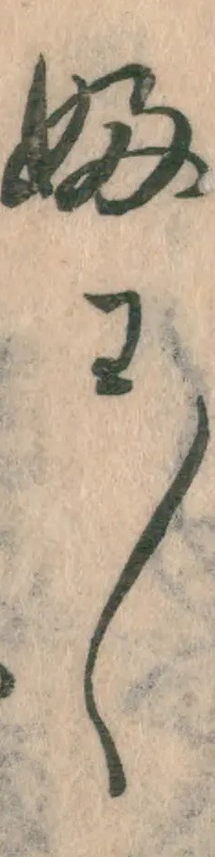ふわ〳〵
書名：豆腐百珍余録
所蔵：国立国会図書館 National Diet Library, JAPAN
